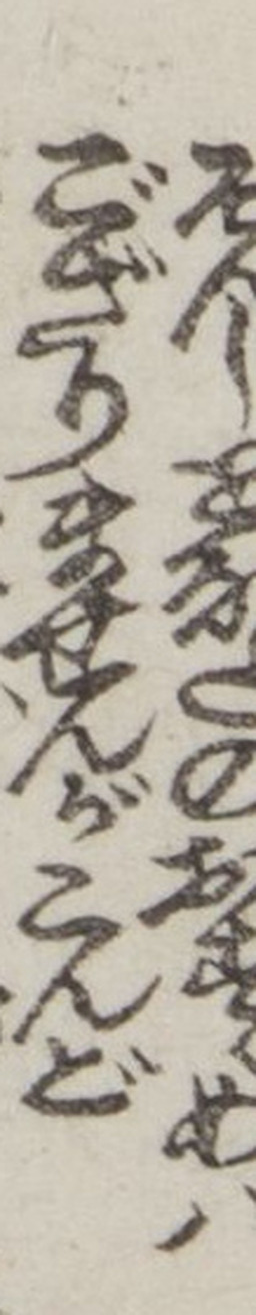ござりませんがこんど
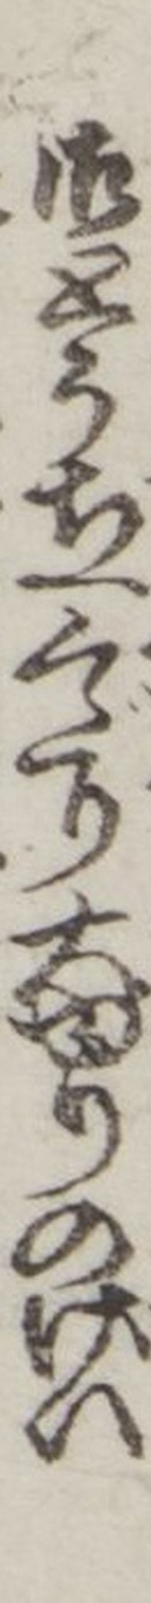御とうちへくだり大ゆりのげい
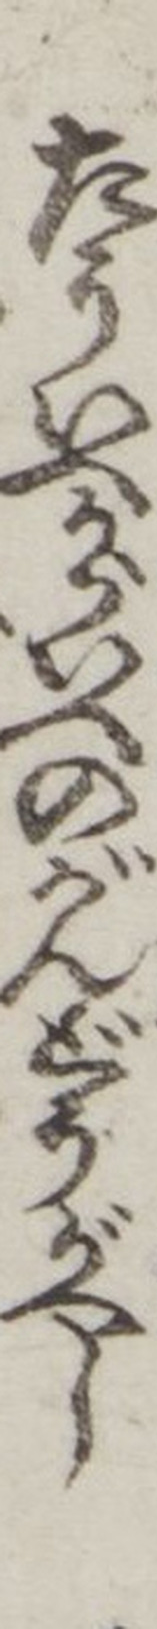たういへからいへのがんどうがえし
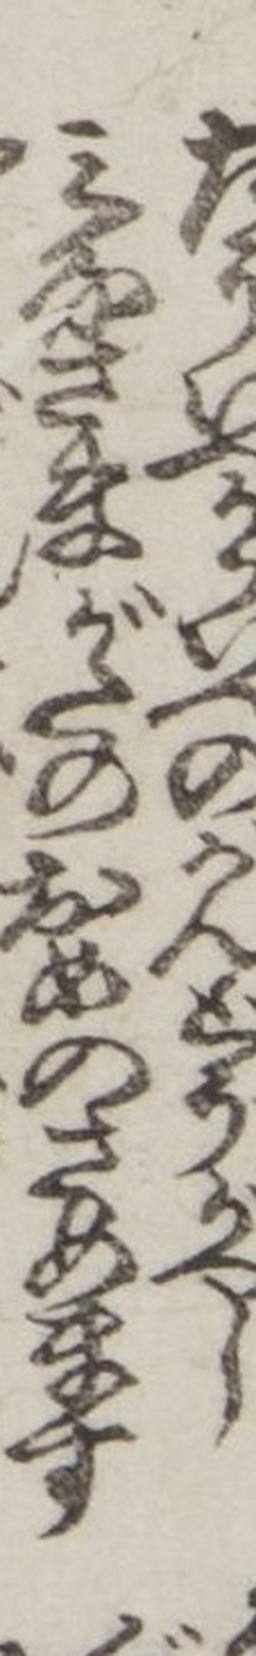みなさまがたのおめのさめます
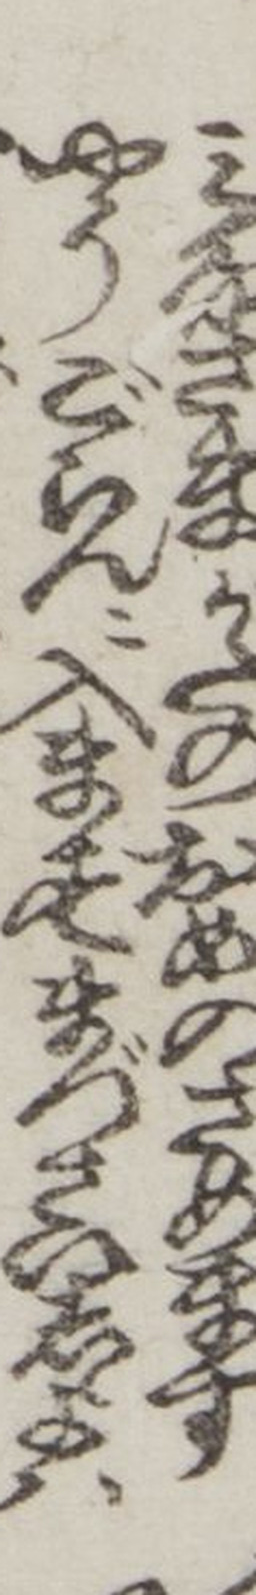やうごらんに入ますまづさいしよは
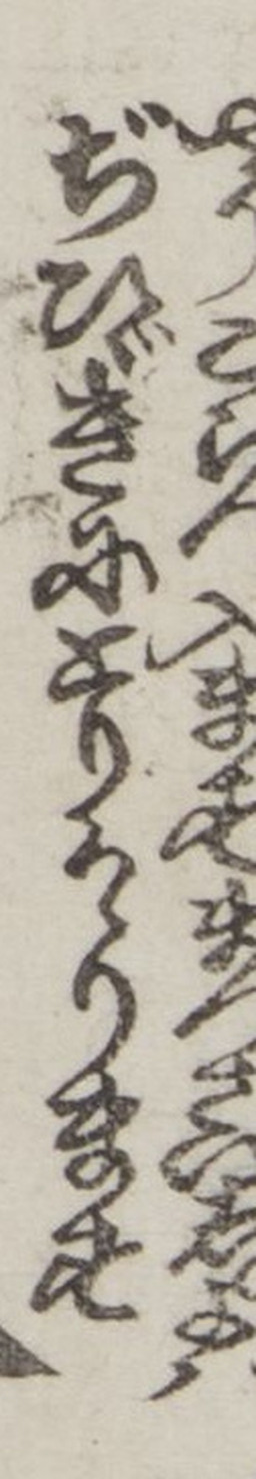ぢひゞきにとりかゝります▲
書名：大坂下りなまずのかるわざ
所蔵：あいおいニッセイ同和損保株式会社
